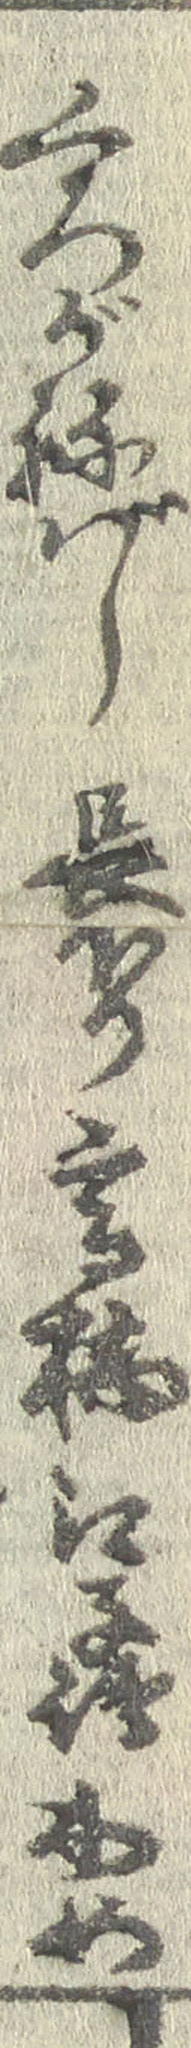くろがねばし長ほり高橋江子嶋かめ
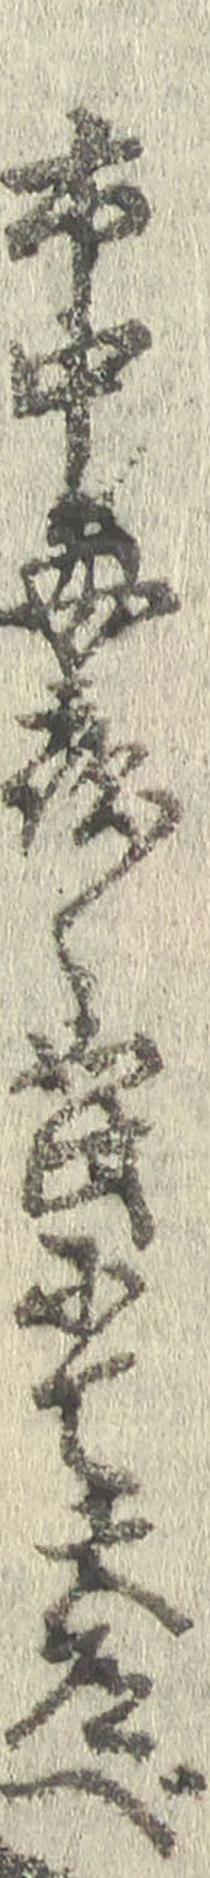市中毎夜〳〵如此にて大道べ
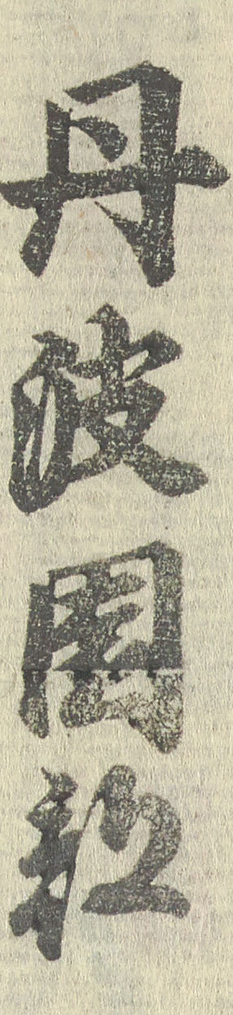丹波園部
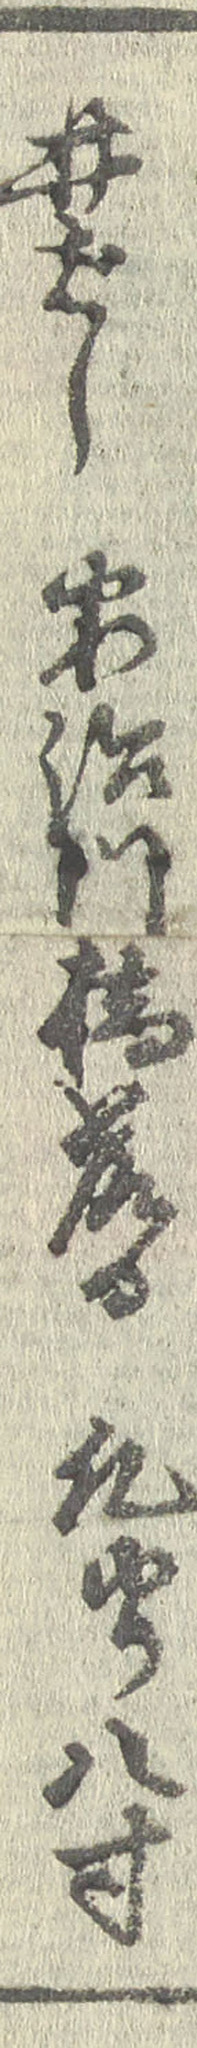井ばし安治川橋落る凡ゆり八寸
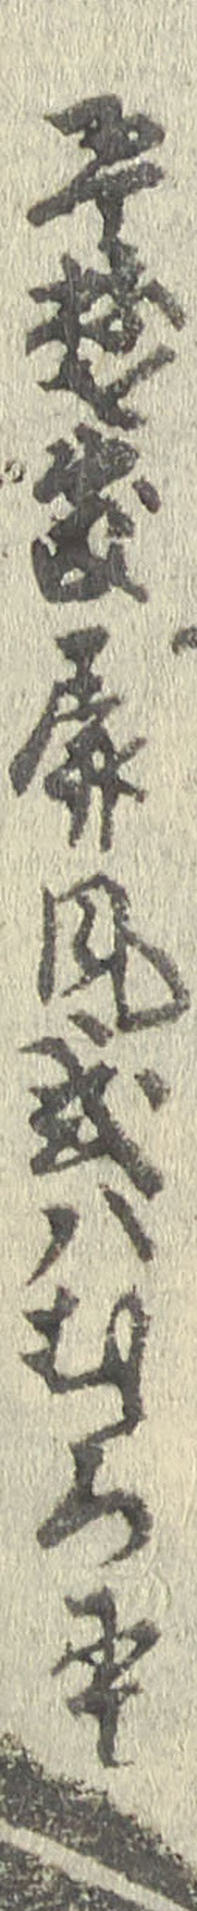畳等を敷屏風或はむしろにて
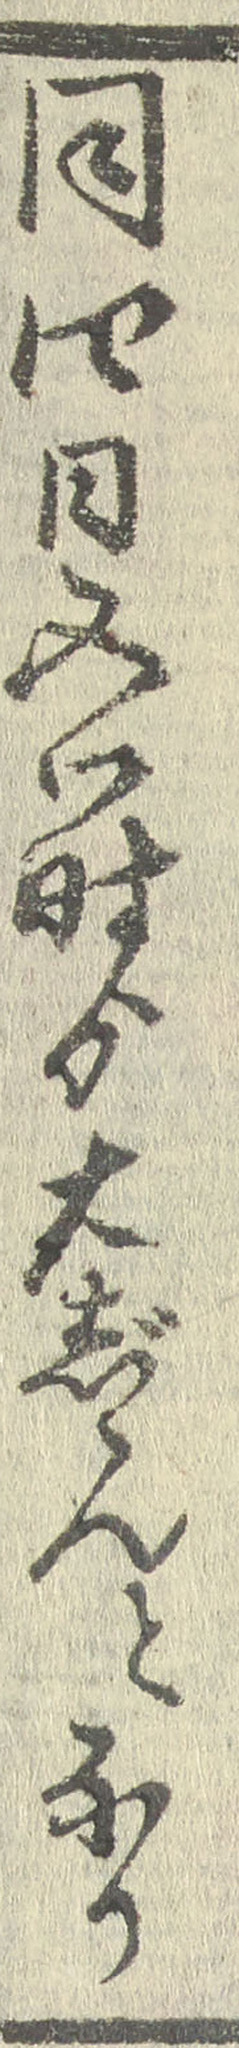同四日五ツ時ゟ大ぢしんとなり
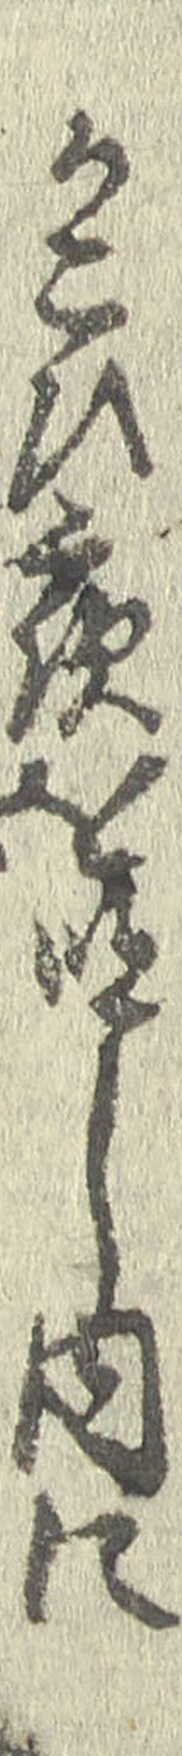かこひ夜を明し内に
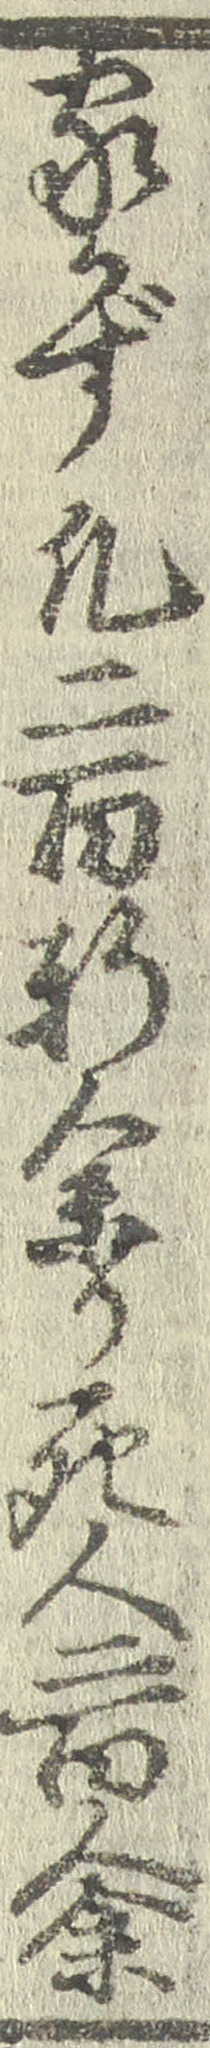家かず凡二百軒余り死人二百人余
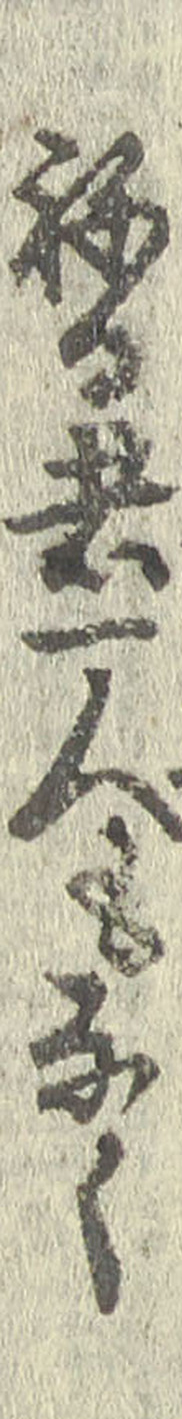ねる者一人もなく
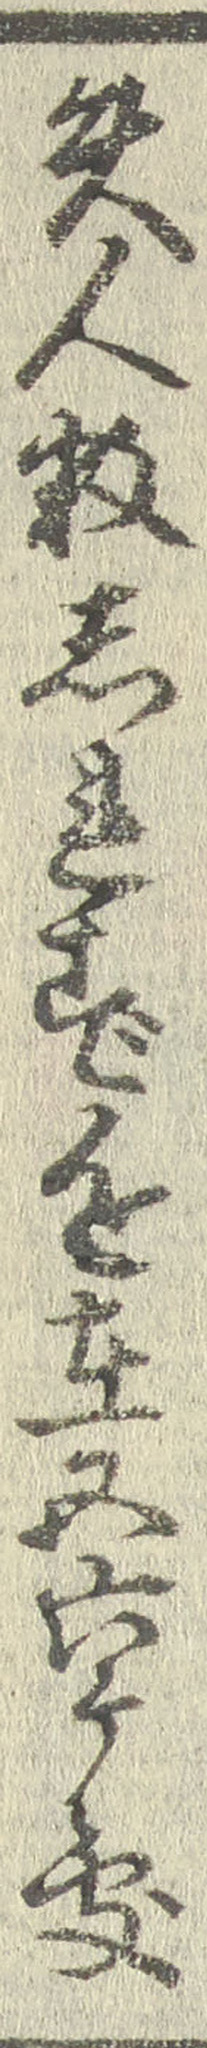失人数しれず近在五六ケ処
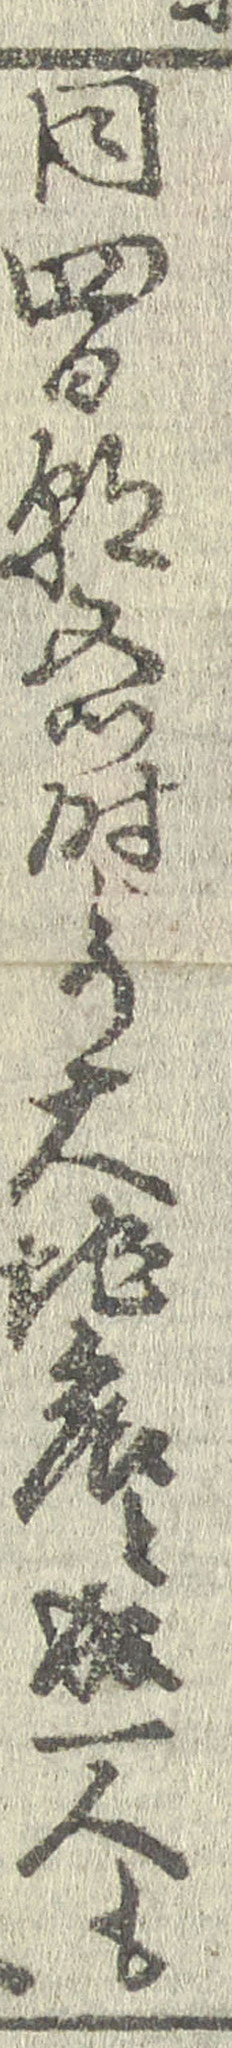同四日朝五ツ時より大地震と成一人も
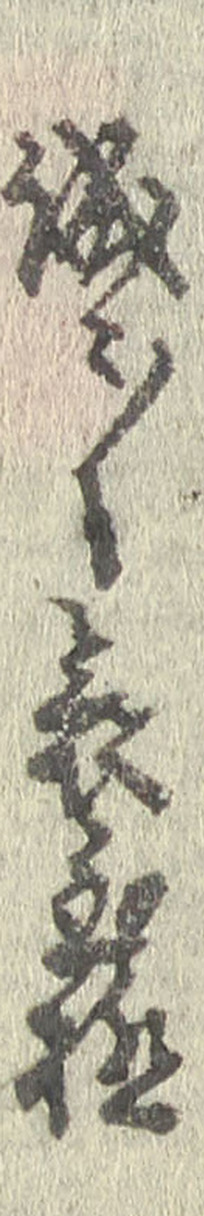誠に〳〵哀至極
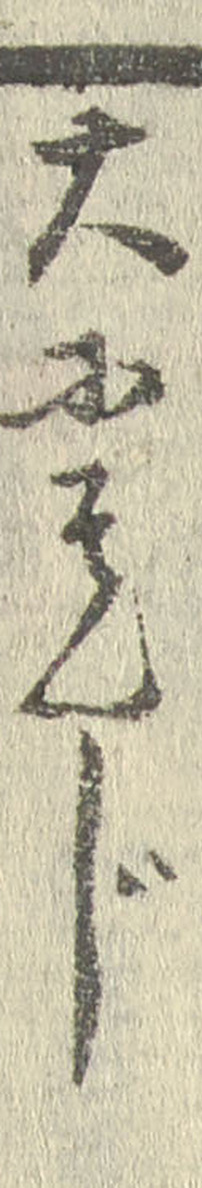大にそんじ
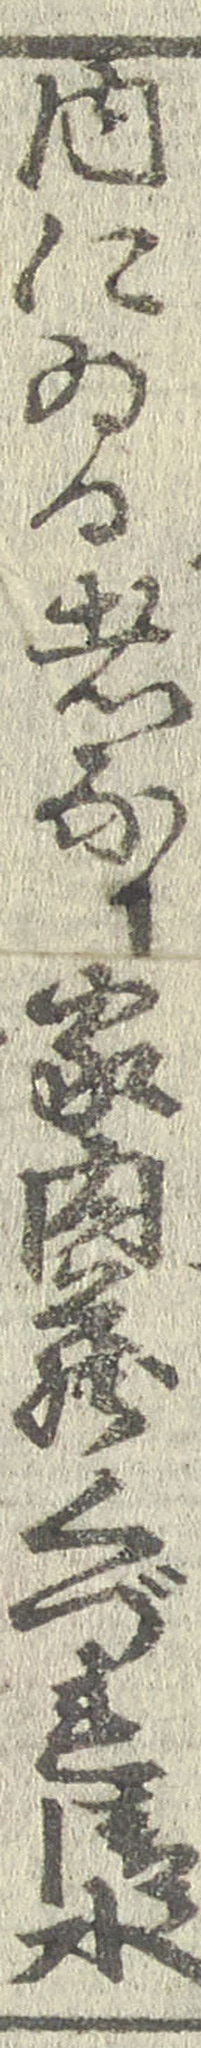内にゐる者なし家内蔵くづれ清水
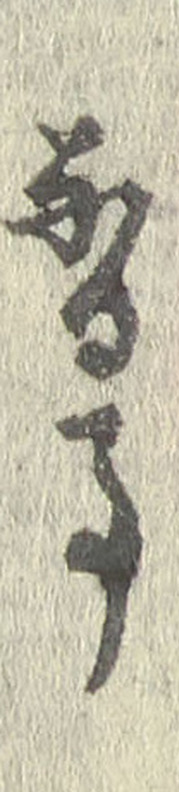なる事
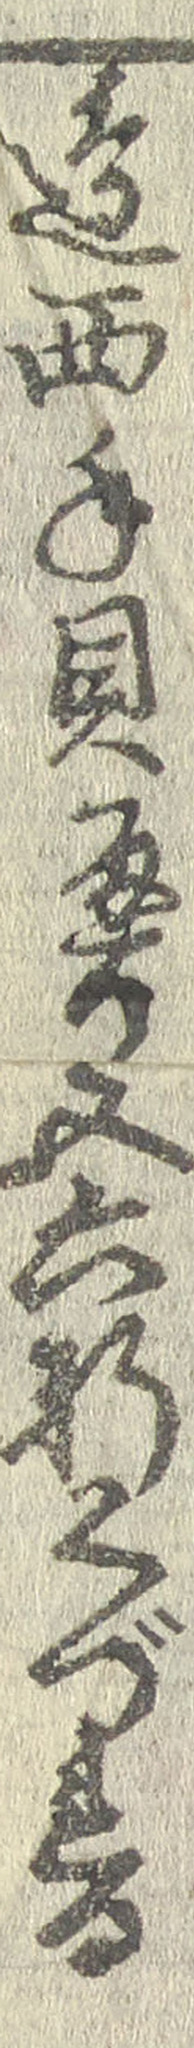辺西手貝通り五六軒くづれる
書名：聞書諸国并大阪大地震つなみ
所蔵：東京大学総合図書館 General Library in the University of Tokyo, JAPAN
